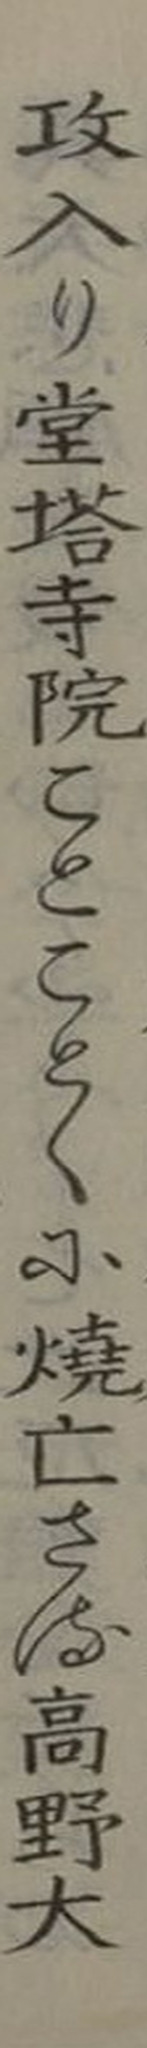攻入り堂塔寺院ことことくに焼亡さる高野大
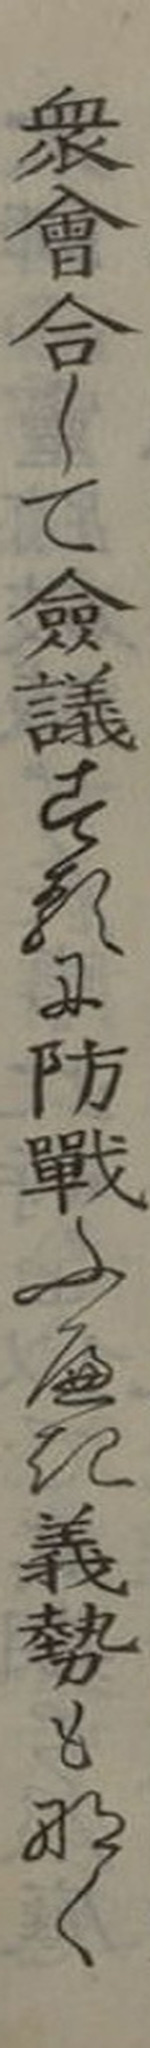衆會合して僉議するに防戰ふせき義勢もなく

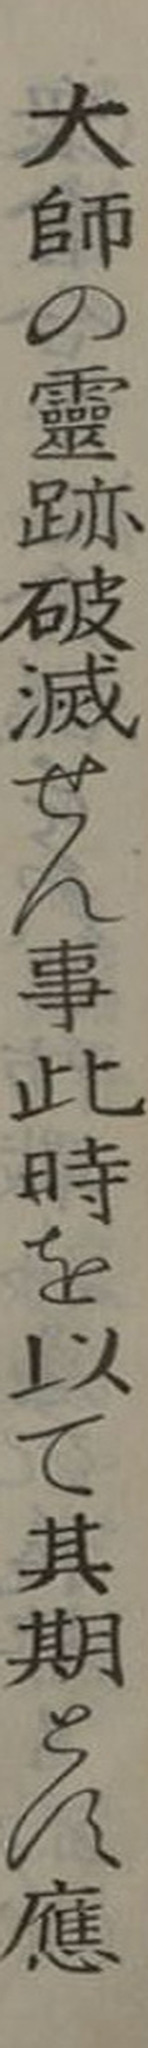大師の靈跡破滅せん事此時を以て其期とす應
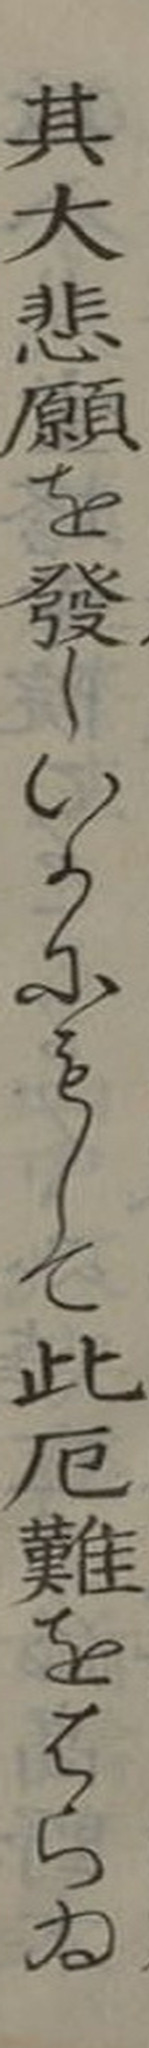其大悲願を發しいかにもして此厄難をはらゐ
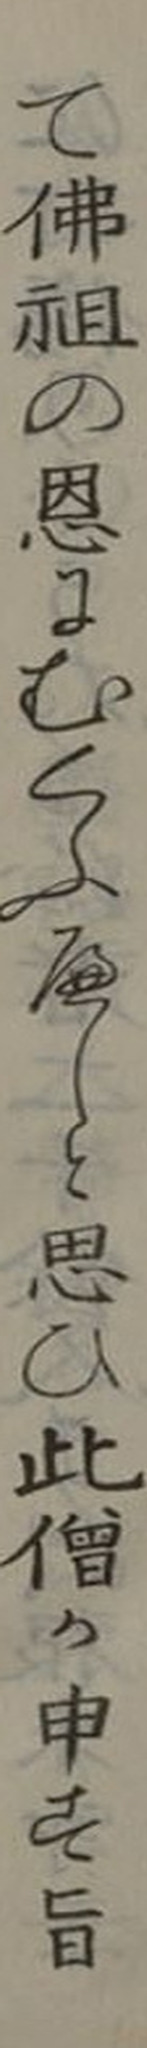て佛祖の恩にむくふへしと思ひ此僧か申す旨
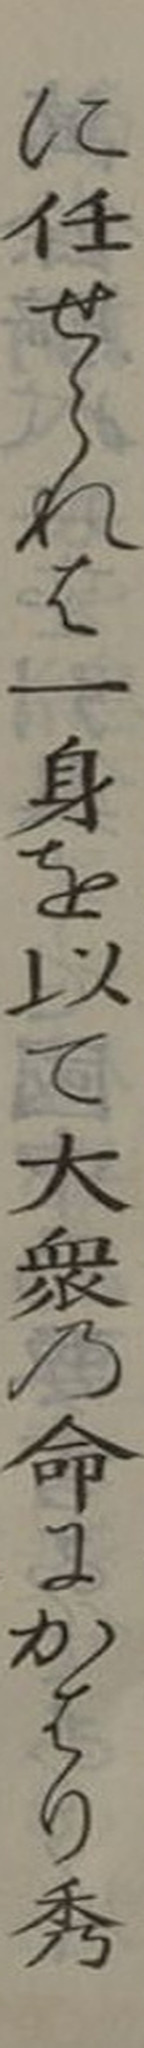に任せられは一身を以て大衆の命にかはり秀
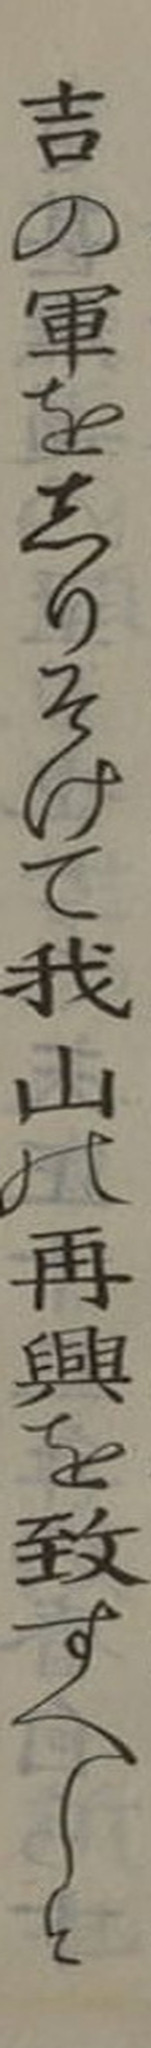吉の軍をしりそけて我山の再興を致すへしと
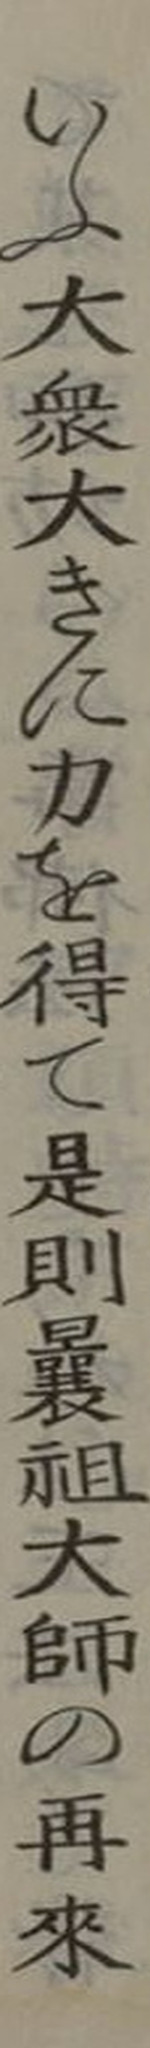いふ大衆大きに力を得て是則曩祖大師の再來
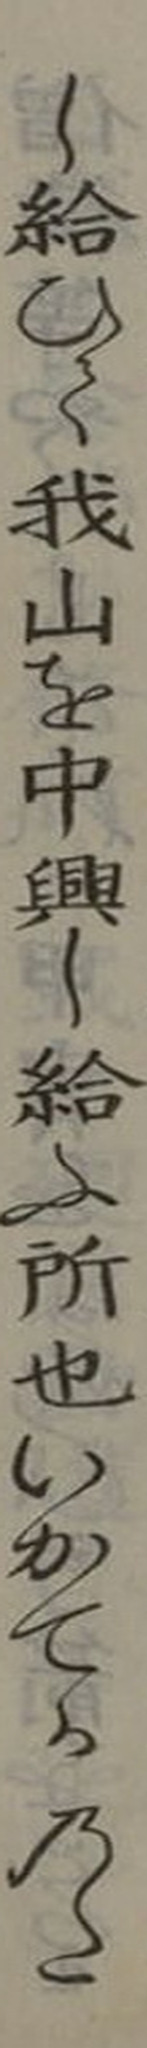し給ひて我山を中興し給ふ所也いかてかのた
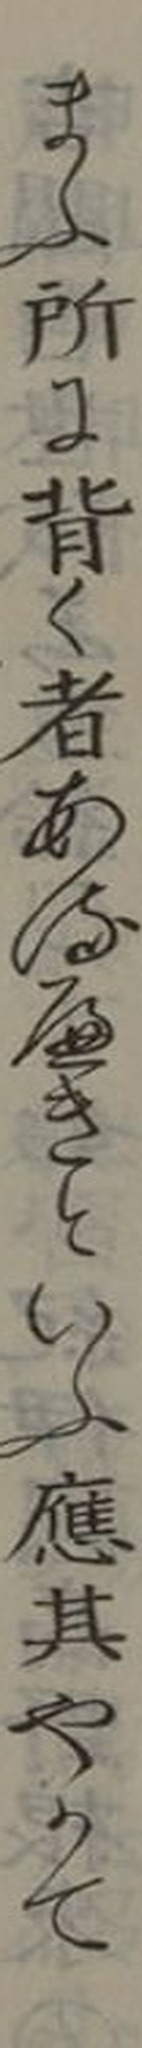まふ所に背く者あるへきといふ應其やかて
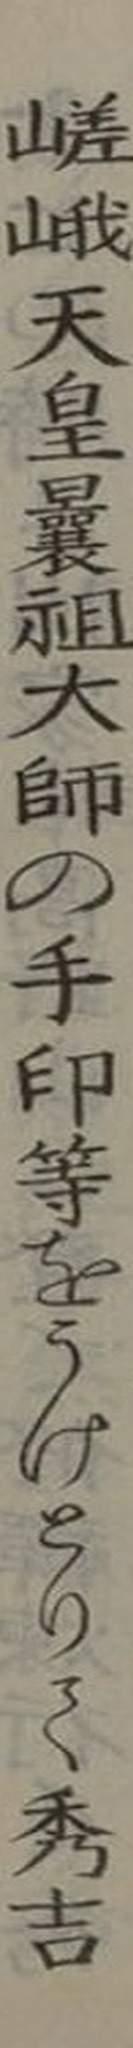嵯峨天皇曩祖大師の手印等をうけとりて秀吉
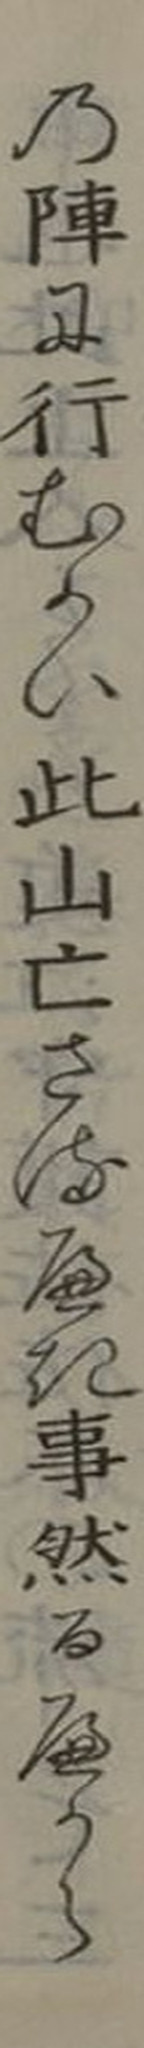の陣に行むかい此山亡さるへき事然るへから
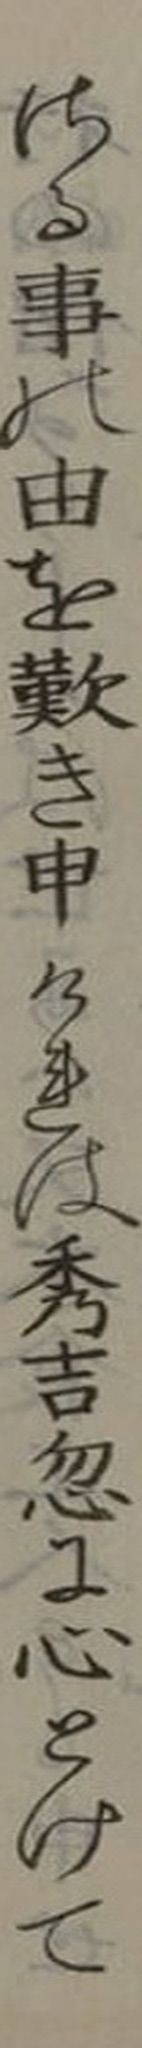さる事の由を歎き申けれは秀吉忽に心とけて
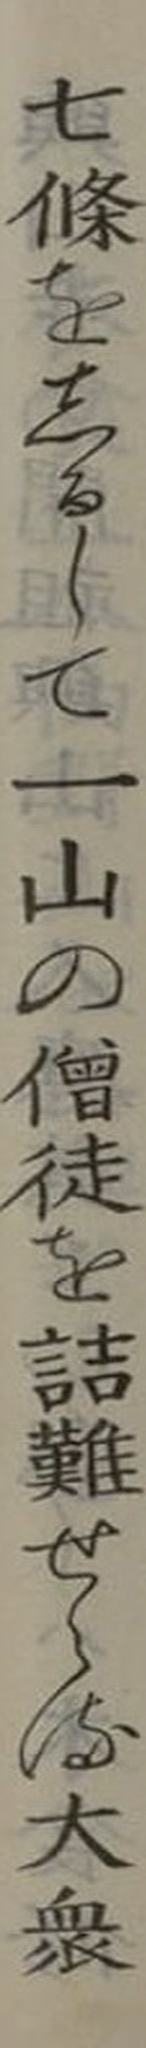七條をしるして一山の僧徒を詰難せらる大衆
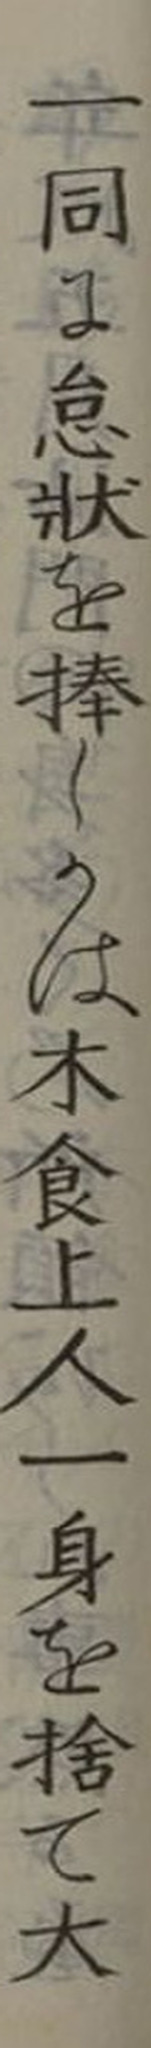一同に怠状を捧しかは木食上人一身を捨て大
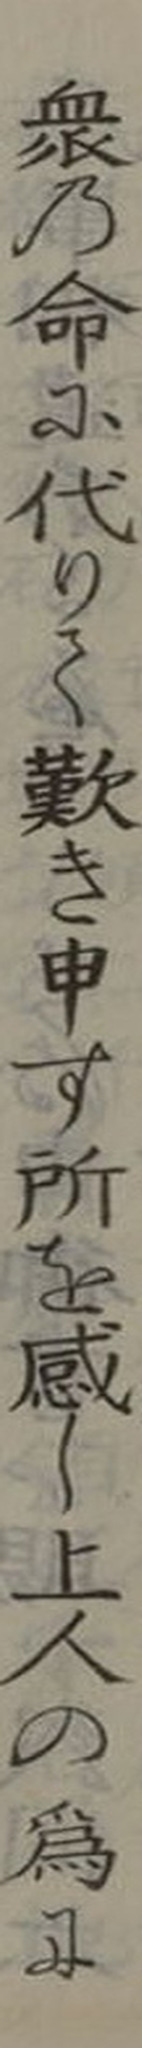衆の命に代りて歎き申す所を感し上人の爲に
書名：骨董録
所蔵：University of the Ryukyus Library
